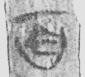百
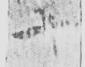七
